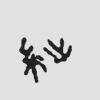絀
